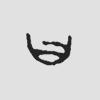曰
